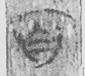百
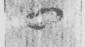四
